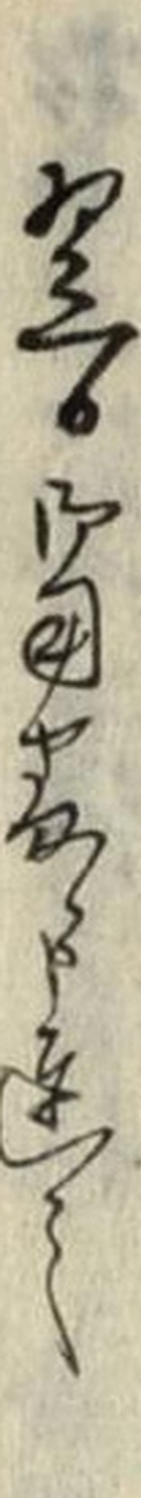翌日御用番へ申達之
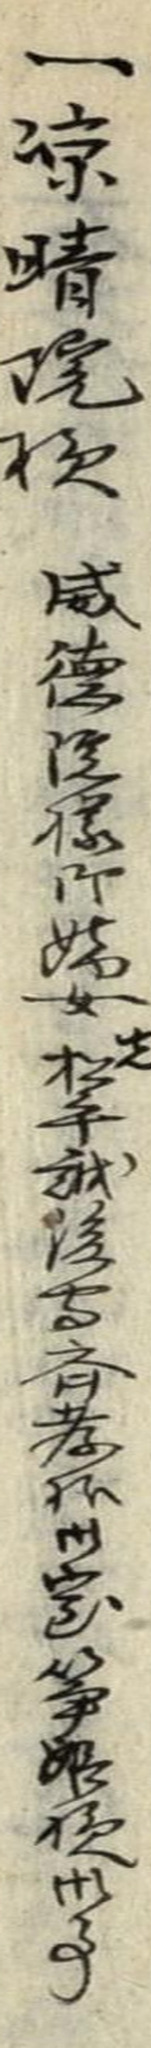一涼晴院様威徳院様御嫡女先松平越後守斉孝様御室筝姫様御事
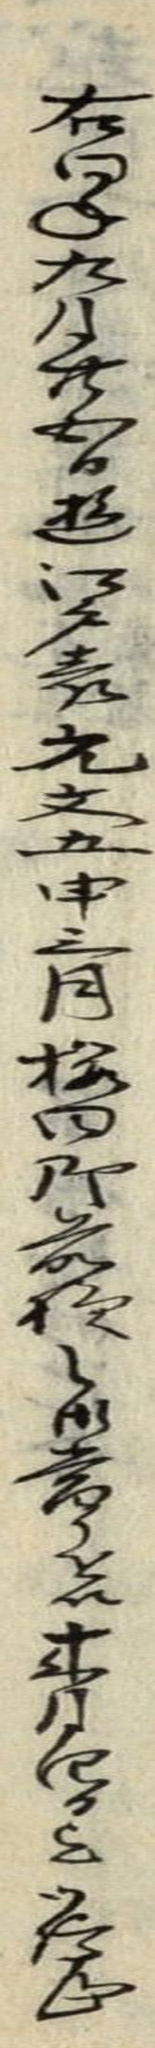右同年九月廿五日逝江戸表元文五申三月桜田御前様之御当りを以来月四日迄御停止
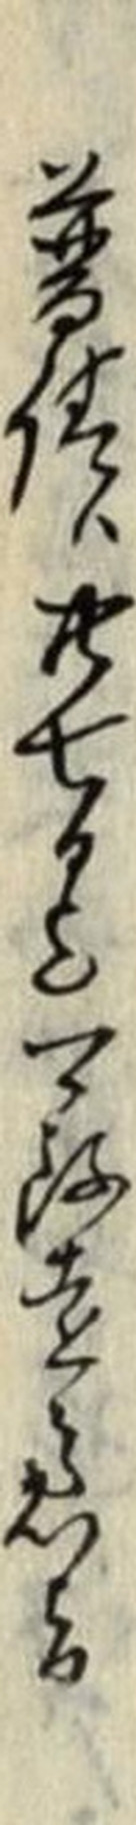普請は廿七日迄可致遠慮旨
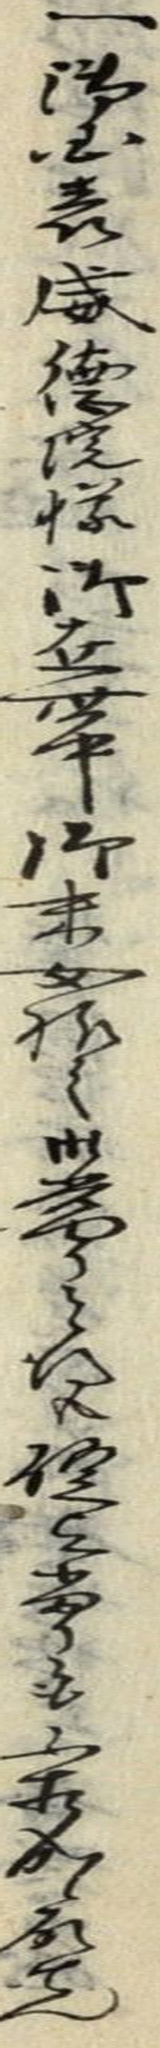一御国表威徳院様御在世中御末女様之御当りに候得共聢と当りにも不相成候故先
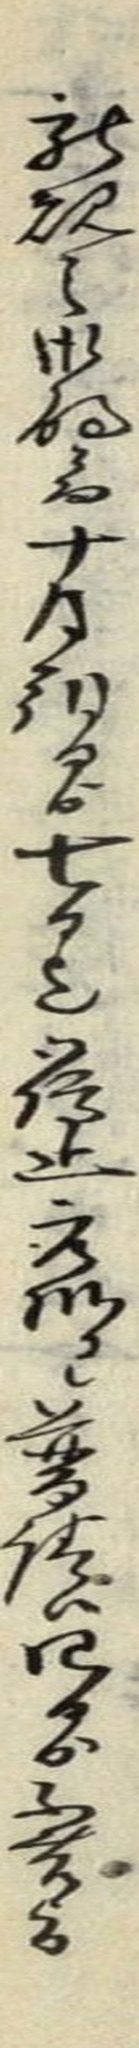新規之御触にて十月朔日ゟ七日迄御停止取掛り候普請は四日ゟ不苦旨
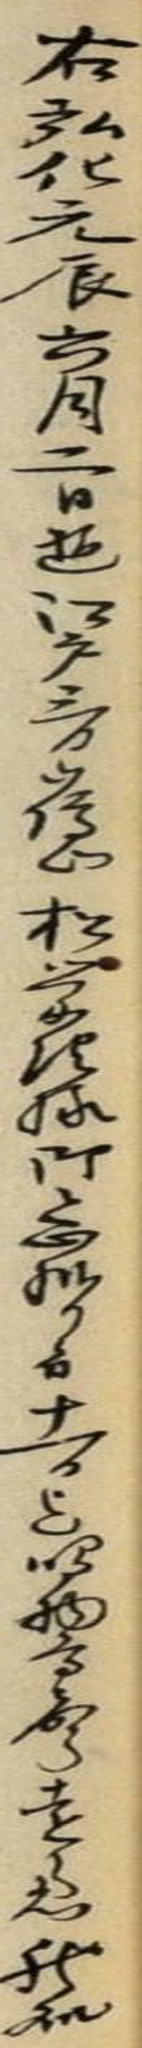右弘化元辰六月二日逝江戸三日御停止松栄院様御忌掛りに付十一日迄鳴物高声遠慮然処
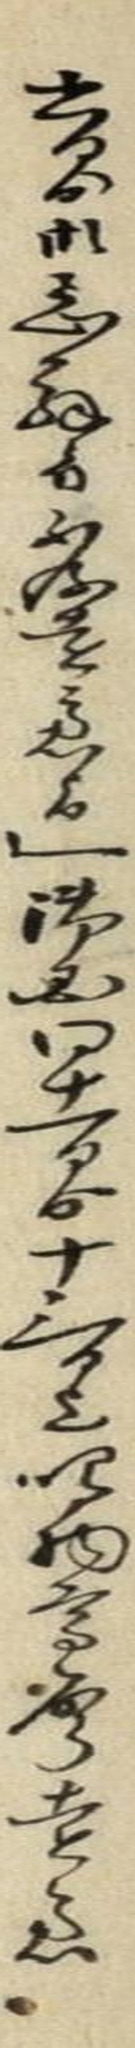六日ゟ御忌解に付不及遠慮旨」御国同十一日ゟ十三日迄鳴物高声遠慮
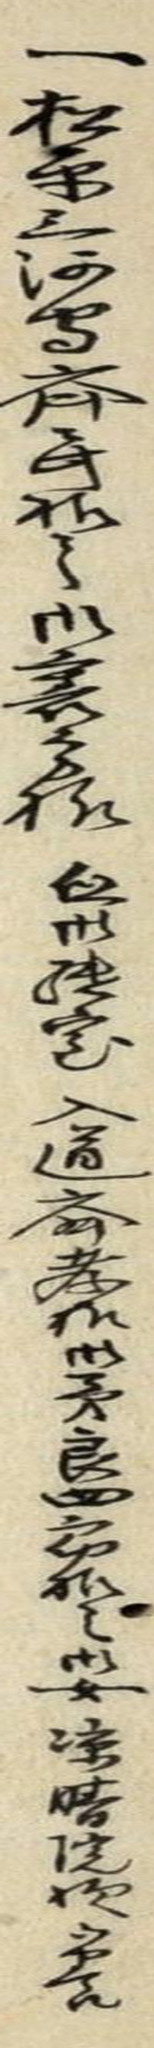一松平三河守斉民様之御裏方様但御継室入道斉孝様御弟良四郎様之御女涼晴院様御養
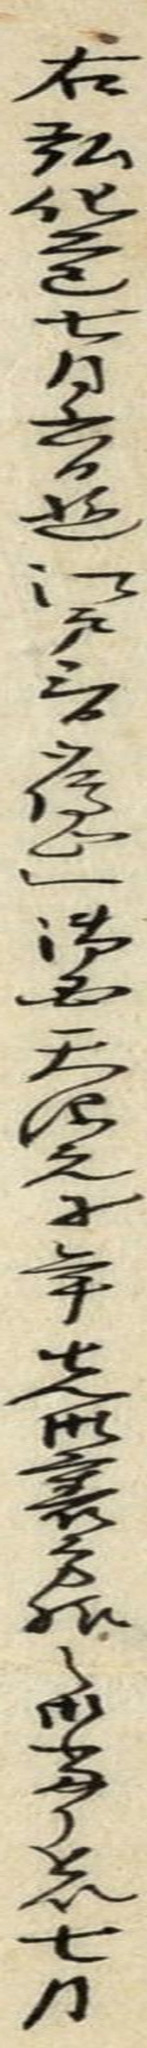右弘化二巳七月六日逝江戸三日御停止」御国天保元刁年先御裏方様之御当りを以七月
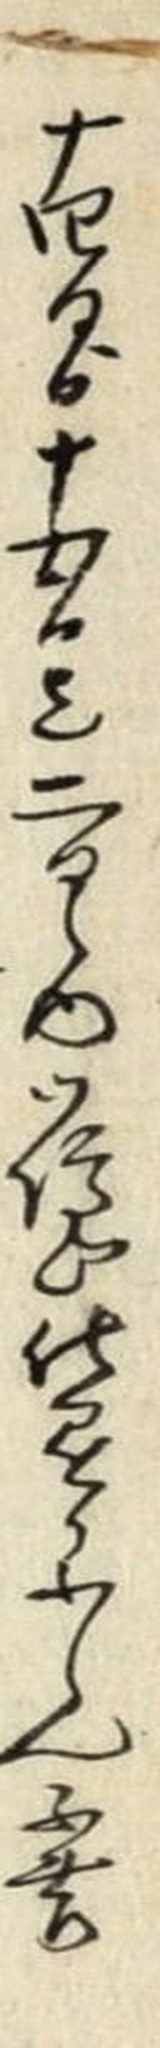十四日ゟ十五日迄二日之内御停止仕懸りふしん不苦
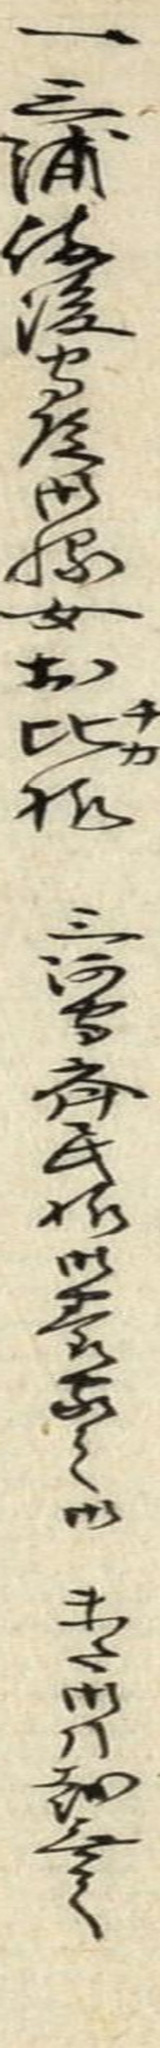一三浦備後守殿御縁女於比様三河守斉民様御養家之御未た御引越無之
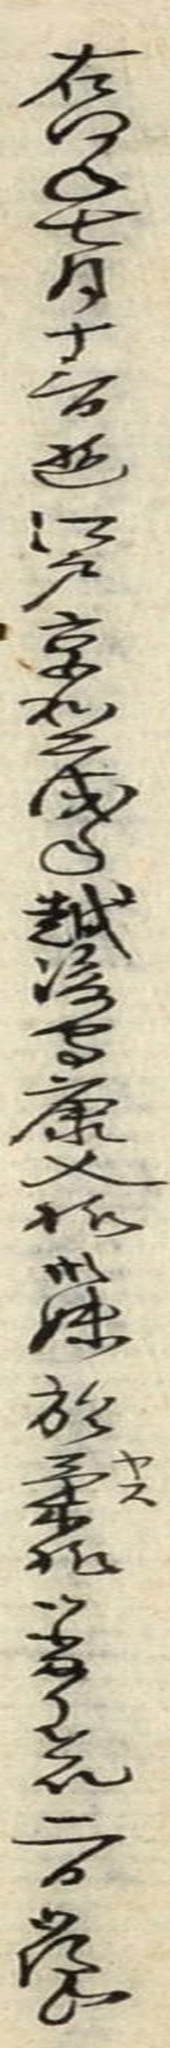右同年七月十三日逝江戸享和二戌年越後守康乂様御妹於柔様御当りを以二日御停止
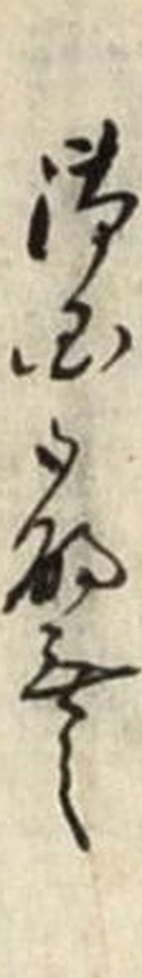御国御触無之
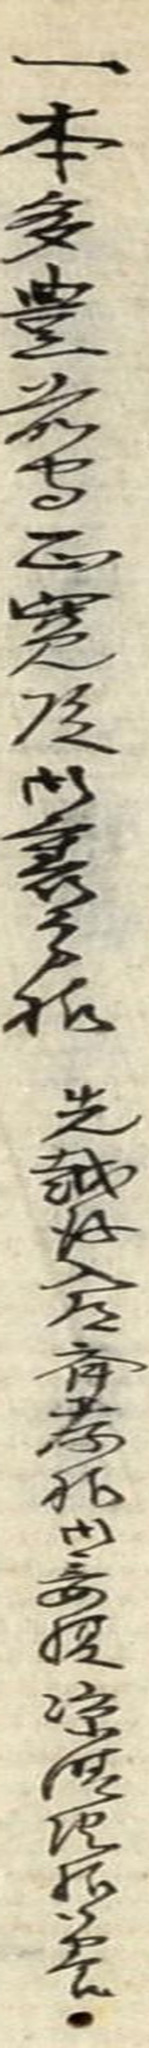一本多豊前守正寛殿御裏方様先越後入道斉孝様御妾腹涼晴院様御養
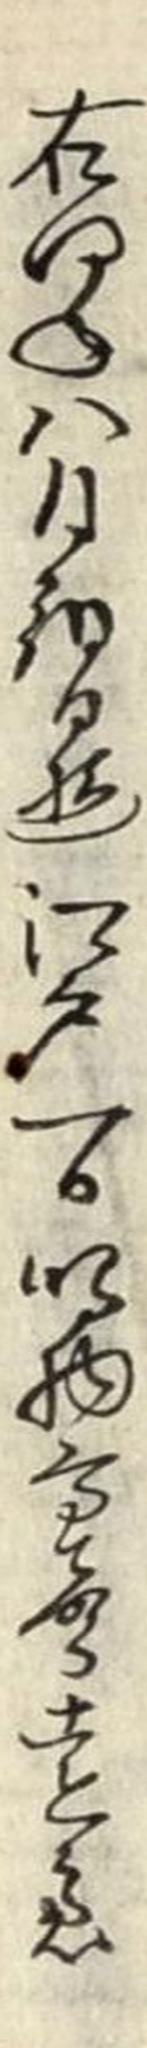右同年八月朔日逝江戸一日鳴物高声遠慮
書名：御停止異変死失
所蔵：福井県文書館 Fukui Prefectural Archives
